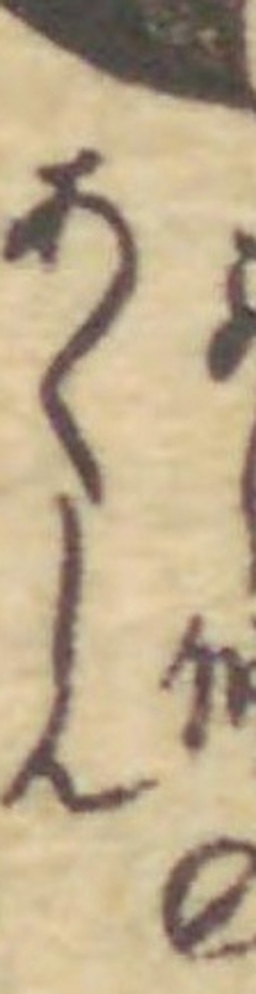あくしん
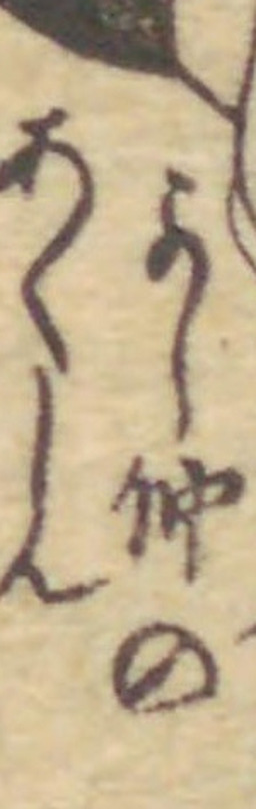あくしん
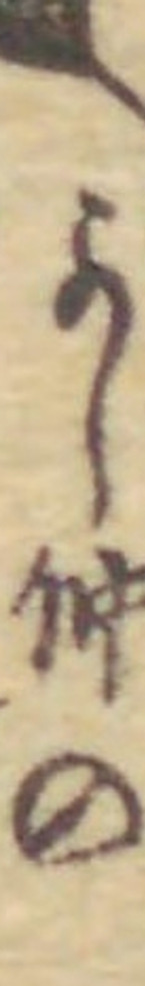よし仲の
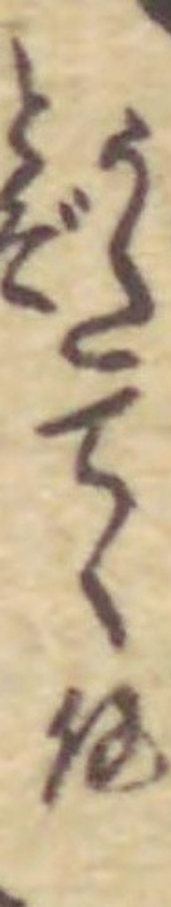うたてゝ何
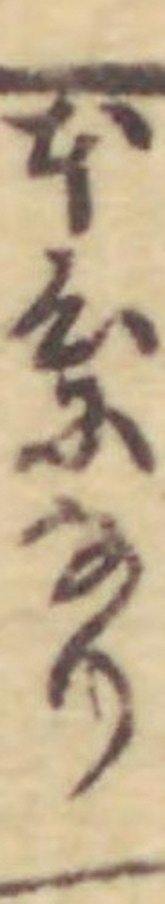本心になり
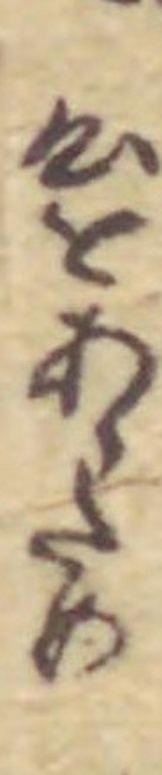心をあらため
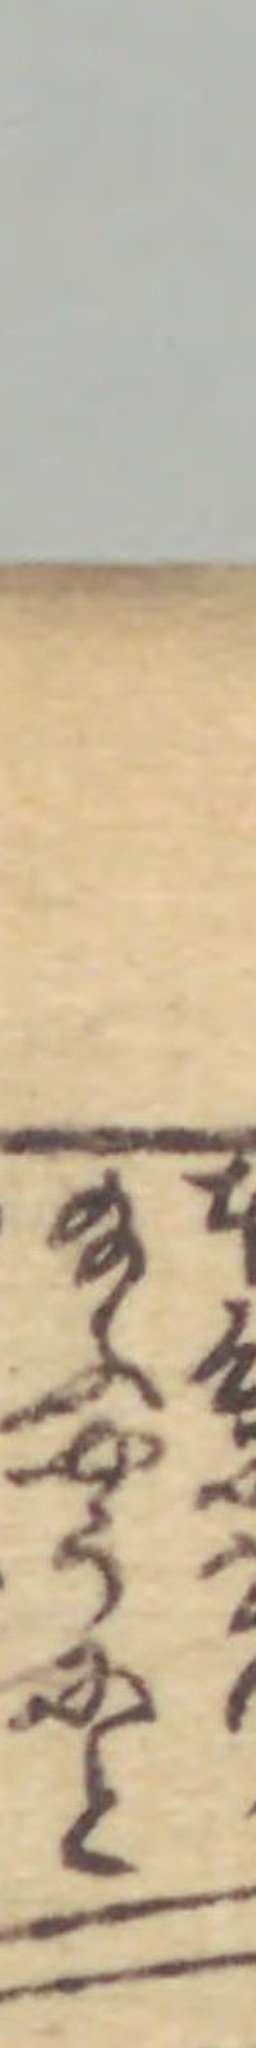給ふやうにと
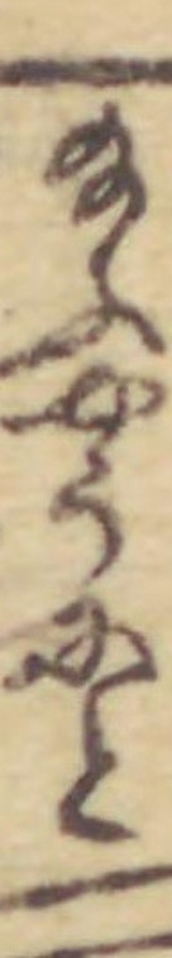給ふやうにと
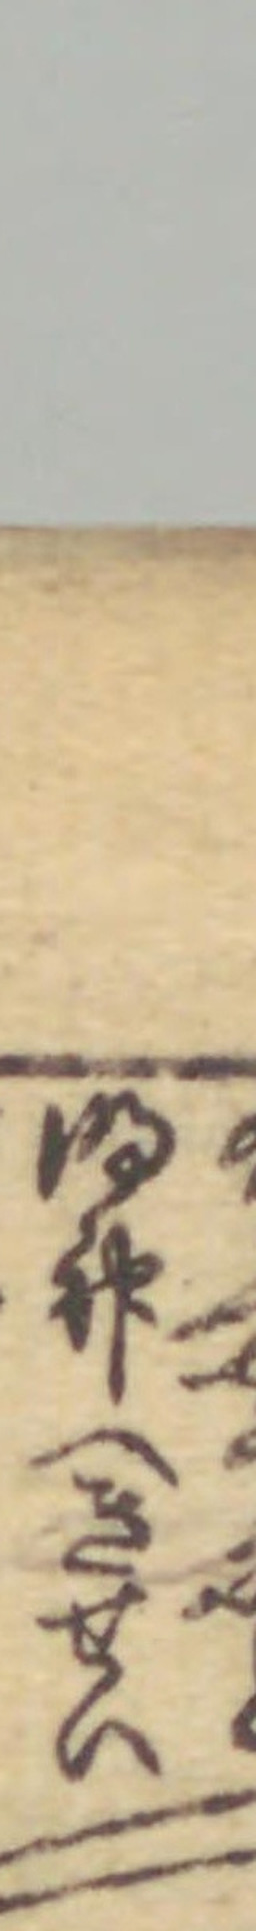明神へきせい
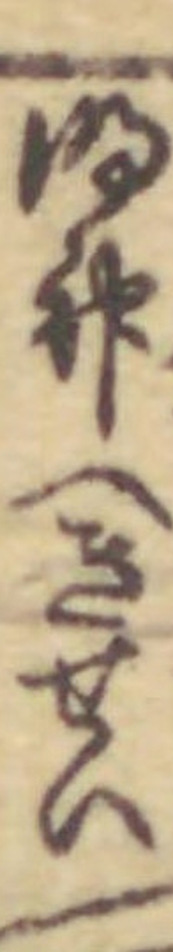明神へきせい
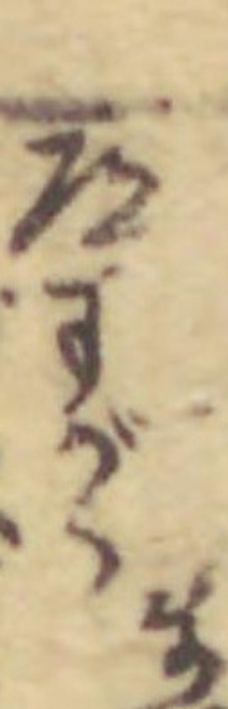路すがら
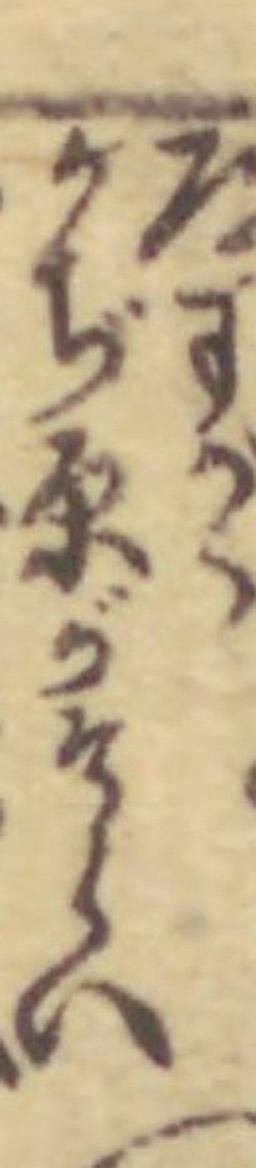かぢ原がけらい
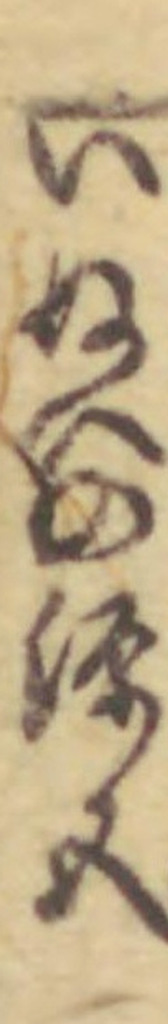いぬいの源五
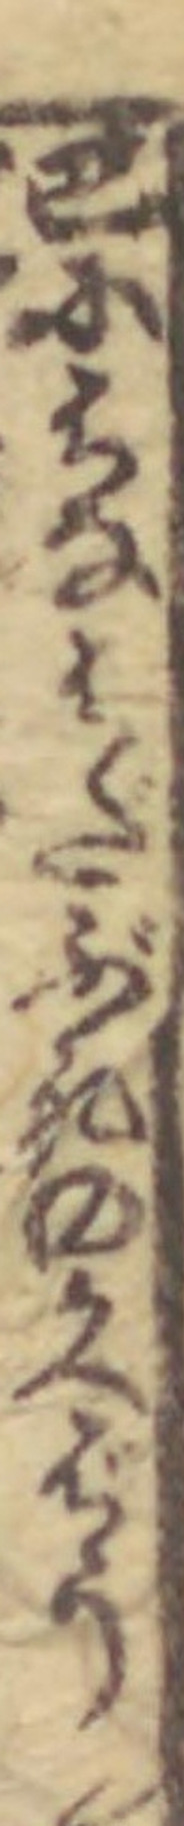巴にはなはだぶ礼のうへばう
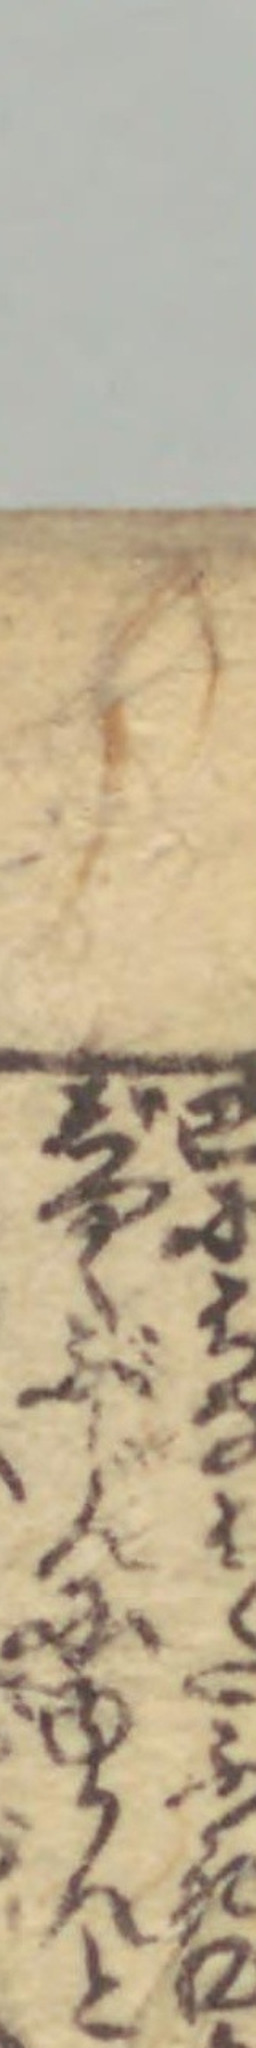じやくぶじんにゆかんと
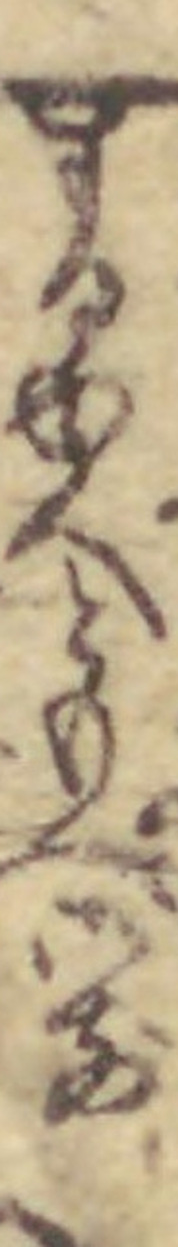するゆへともへ御前
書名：朝比奈草摺実記 2巻
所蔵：国立国会図書館 National Diet Library, JAPAN
